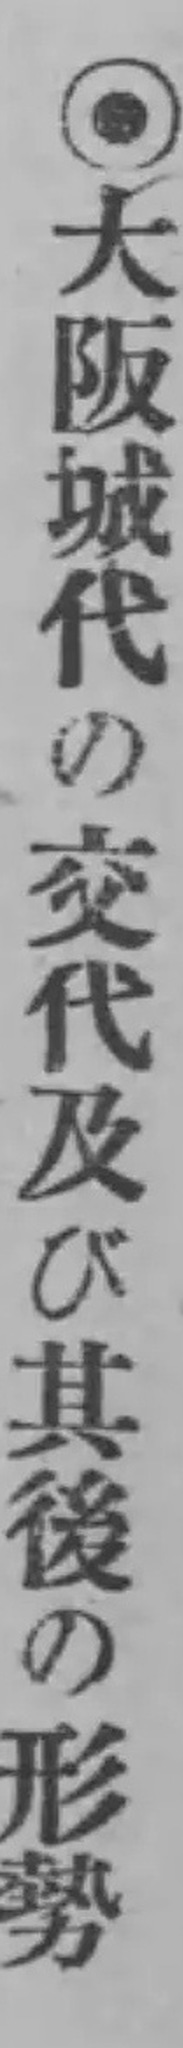⦿大阪城代の交代及び其後の形勢
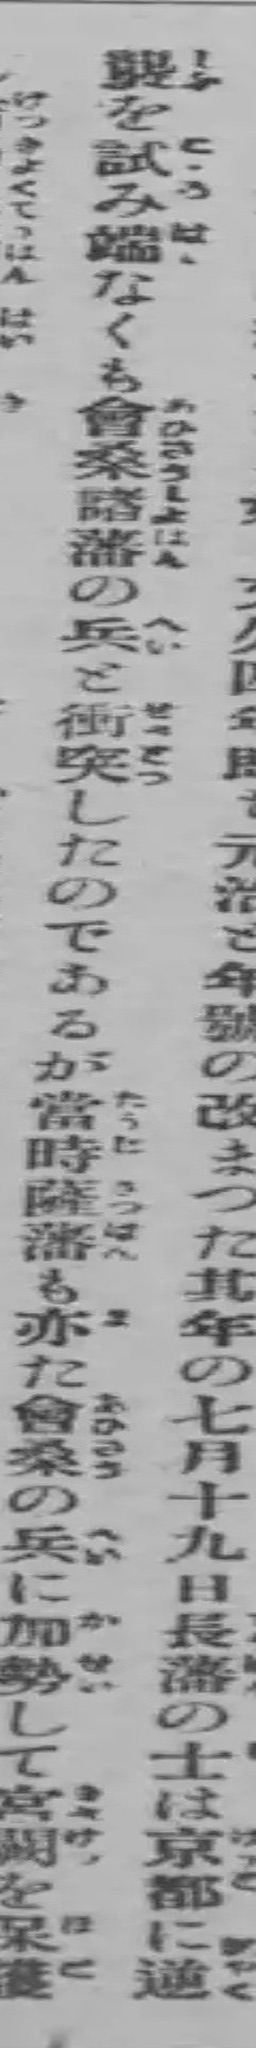襲を試み端なくも会桑緒藩の兵と衝突したのであるが当時薩藩も亦た会桑の兵に加勢して宮闕を保護
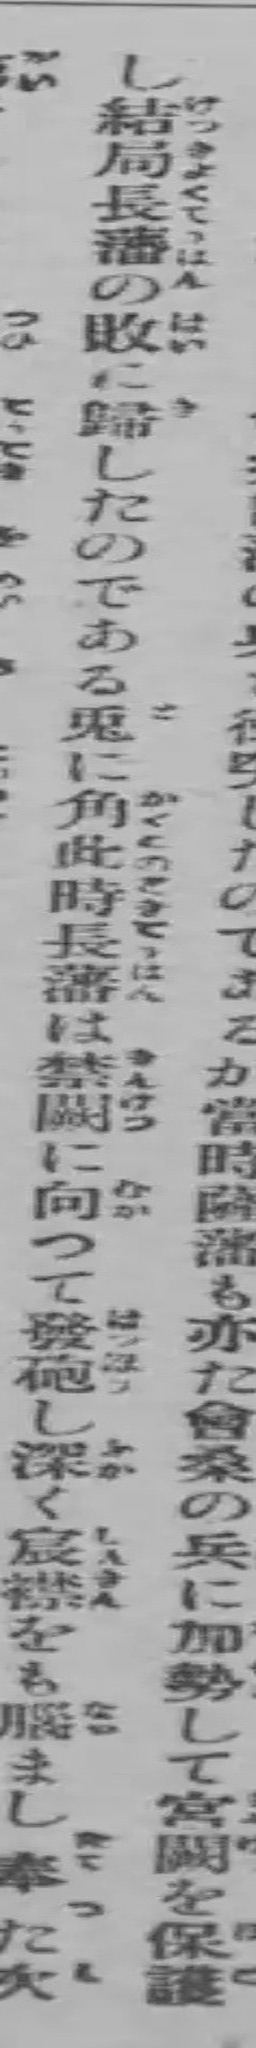し結局長藩の敗に帰したのである兎に角此時長藩は禁闕に向つて発砲し深く宸襟をも脳まし奉た次
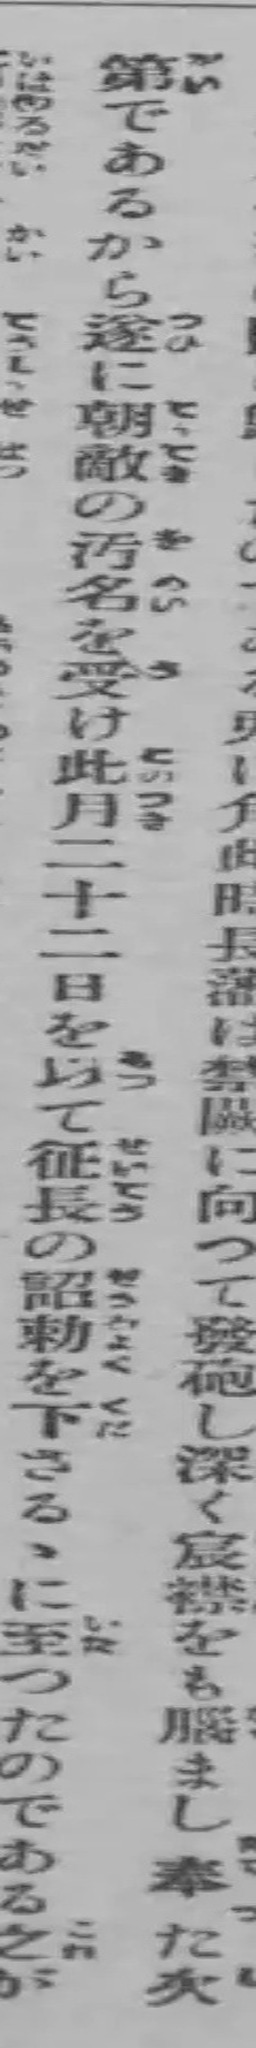第であるから遂に朝敵の汚名を受け此月二十二日を以て征長の詔勅を下さるゝに至つたのである之が
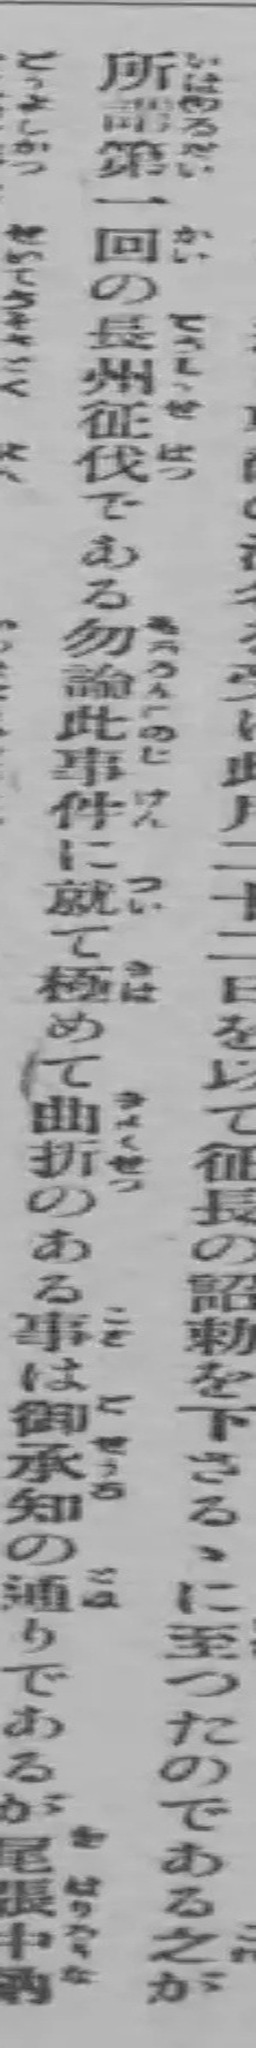所謂第一回の長州征伐である勿論此事件に就て極めて曲折のある事は御承知の通りであるが尾張中納
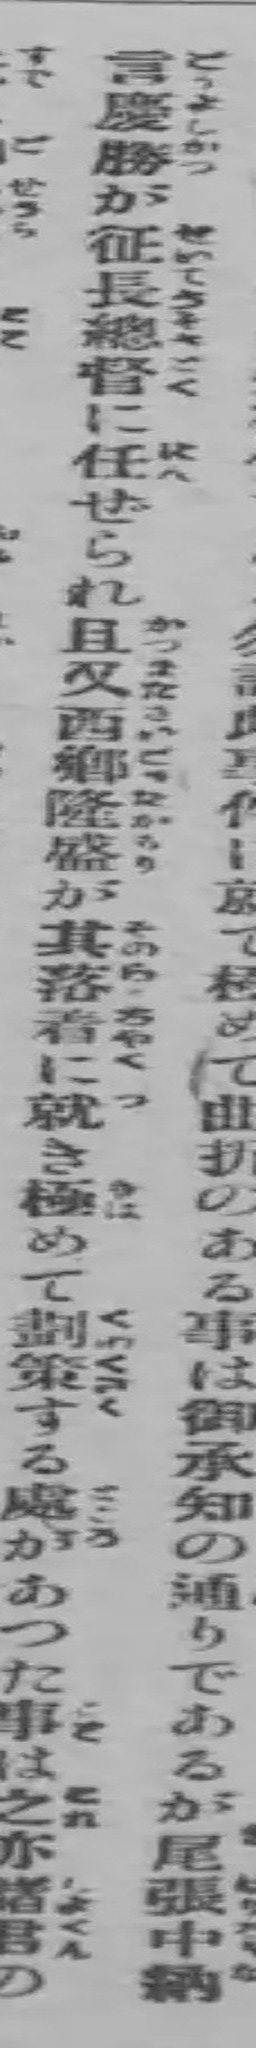言慶勝が征長総督に任ぜられ且又西郷隆盛が其落着に就き極めて画策する処があつた事は之亦諸君の
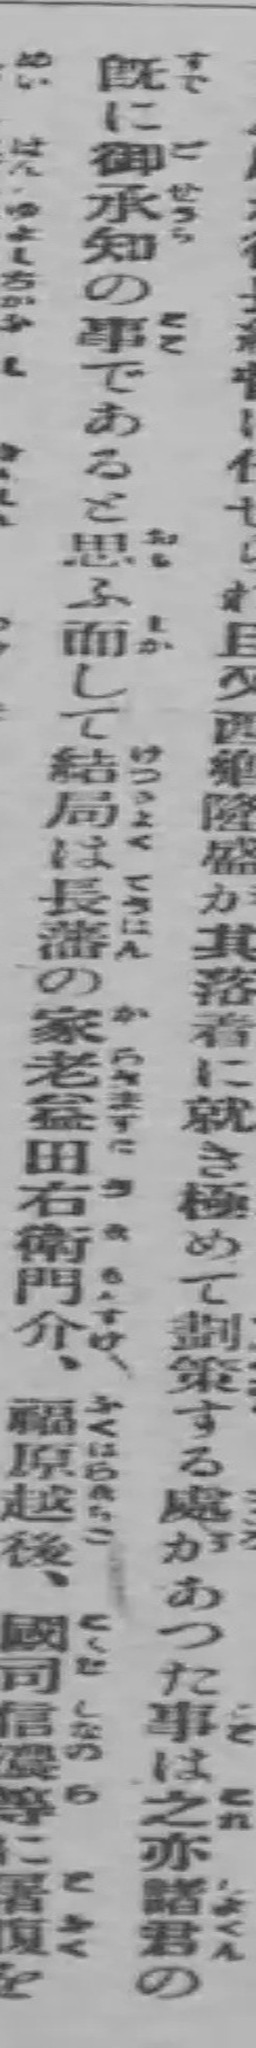既に御承知の事であると思ふ而して結局は長藩の家老増田右衛門介、福原越後、国司信濃等に屠腹を
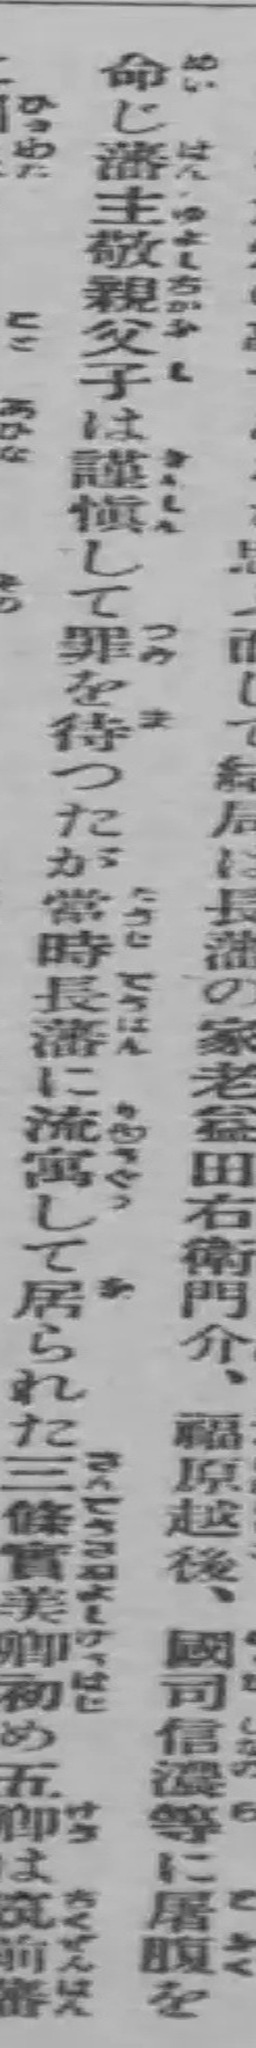命じ藩主敬親父子は謹慎して罪を待つたが当時長藩に流寓して居られた三條実美卿初め五卿は筑前藩
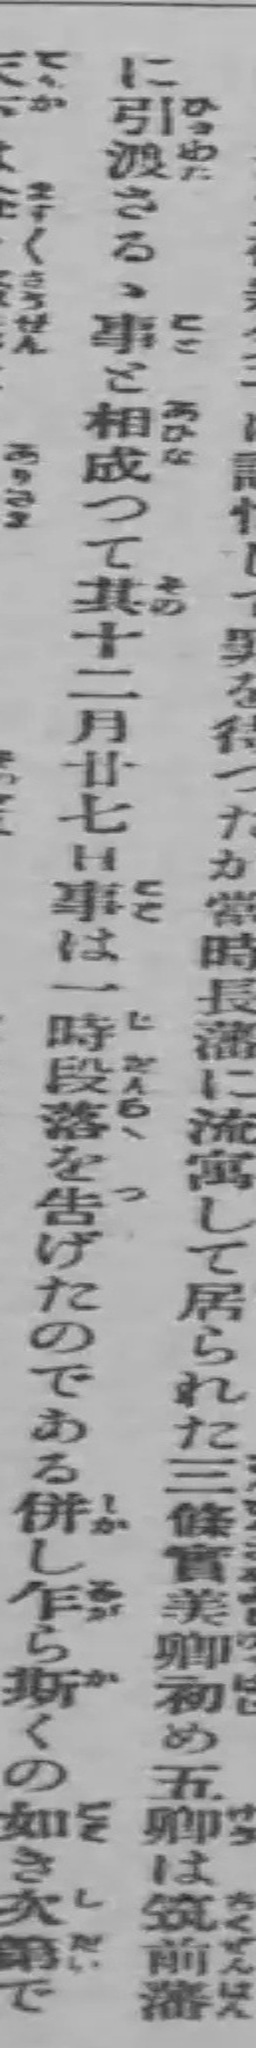に引渡さるゝ事と相成つて其十二月廿七日事は一時段落を告げたのである併し乍ら斯くの如き次第で
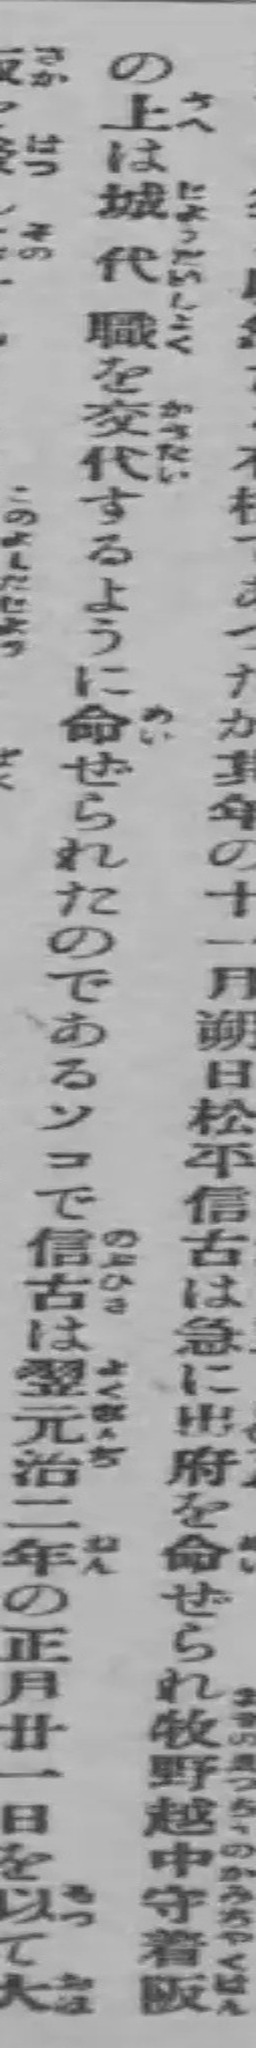の上は城代職を交代するように命ぜられたのであるソコで信古は翌元治二年の正月廿一日を以て大
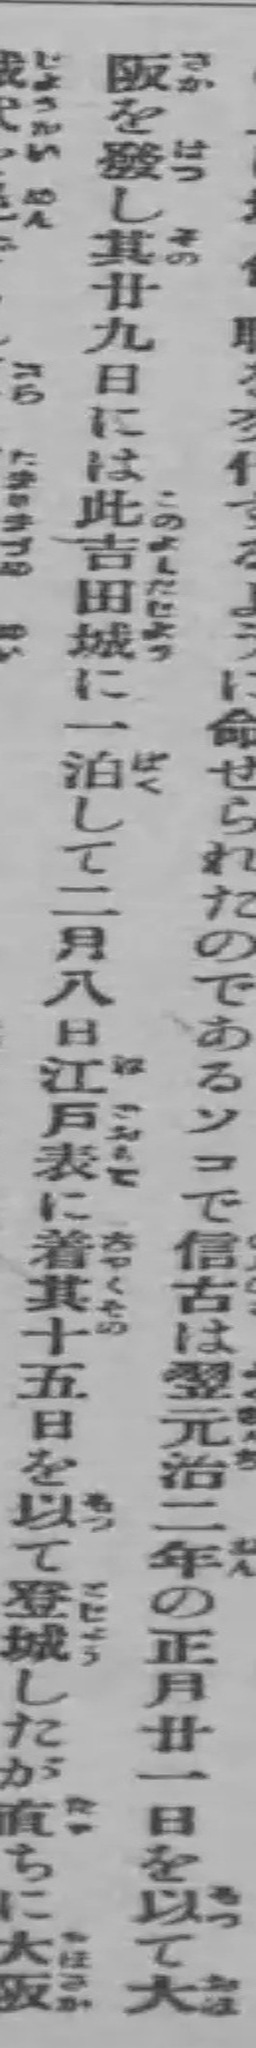阪を発し其廿九日には此吉田城に一泊して二月八日江戸表に着其十五日を以て登城したが直ちに大阪
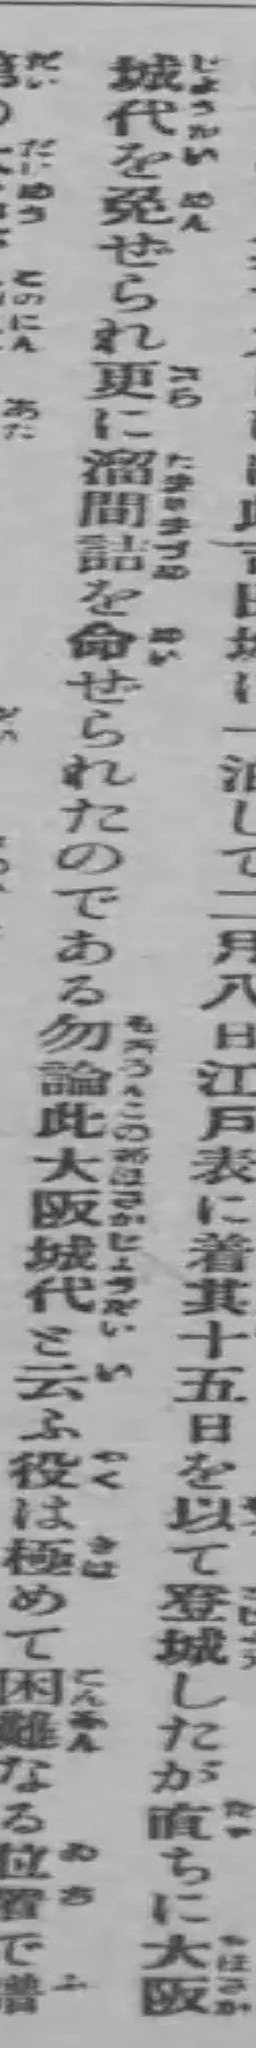城代を免ぜられ更に溜間詰を命ぜられたのである勿論此大阪城代と云ふ役は極めて困難なる位置で譜
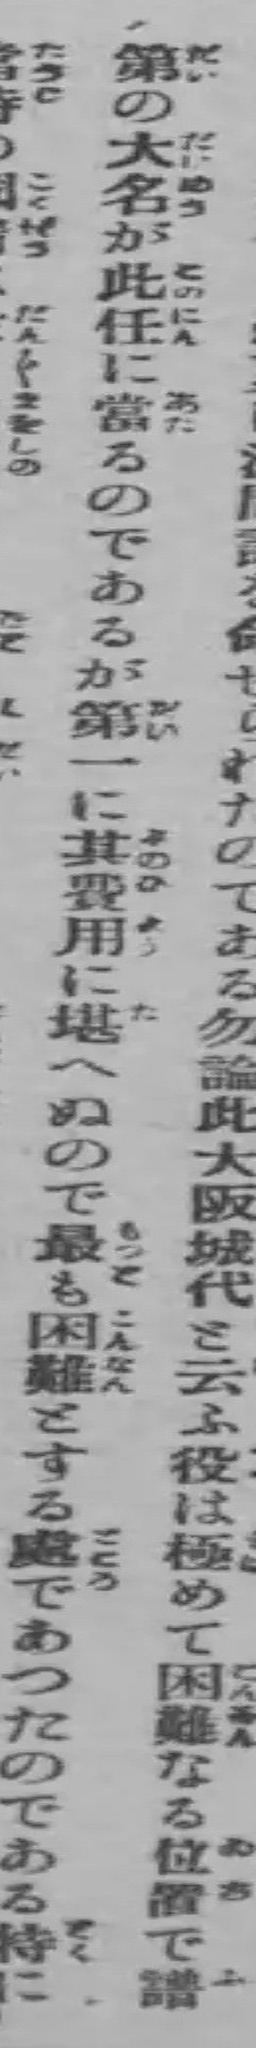第の大名が此任に当るのであるが第一に其費用に堪へぬので最も困難とする処であつたのである特に
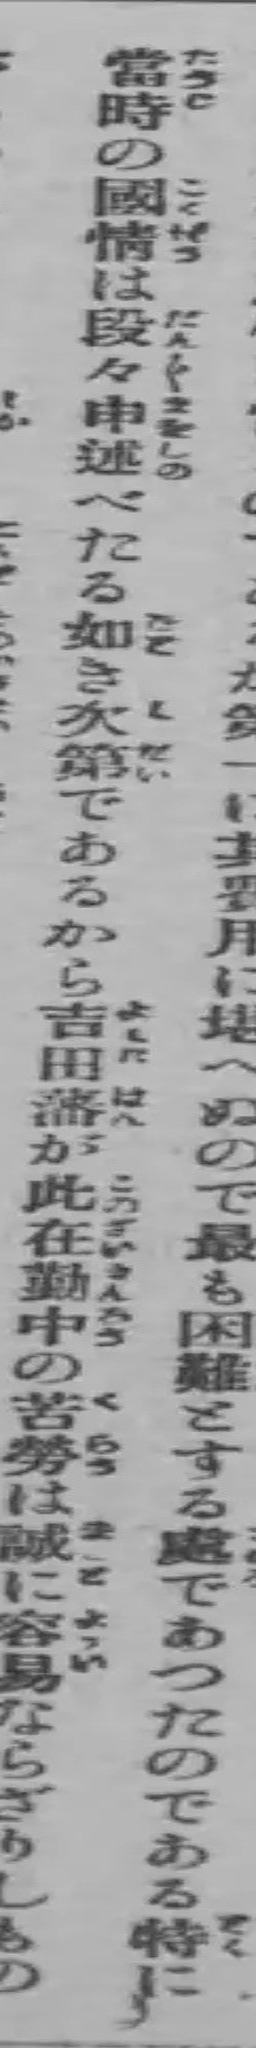当時の国情は段々申述べたる如き次第であるから吉田藩が此在勤中の苦労は誠に容易ならざりしもの
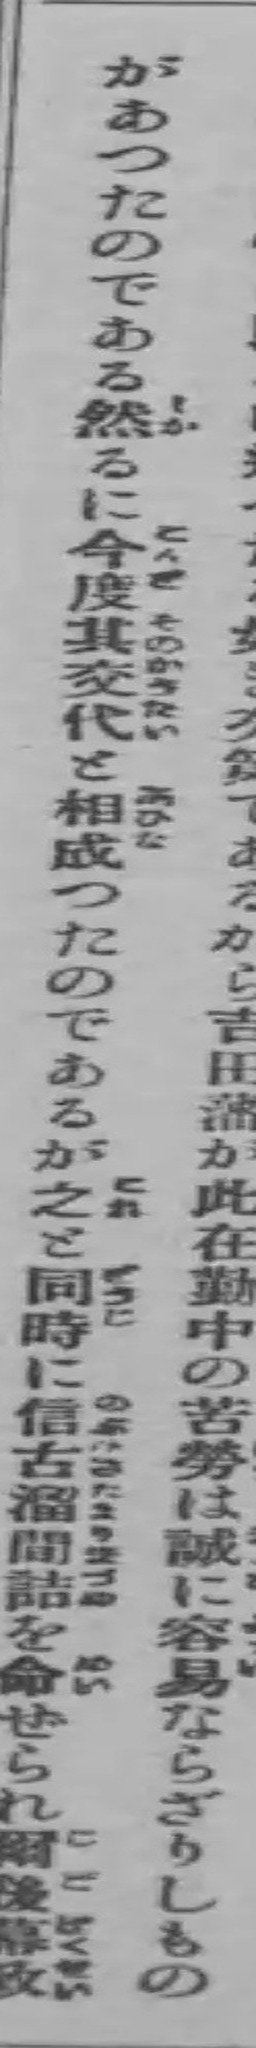があつたのである然るに今度其交代と相成つたのであるが之と同時に信古溜間詰を命ぜられ爾後幕政
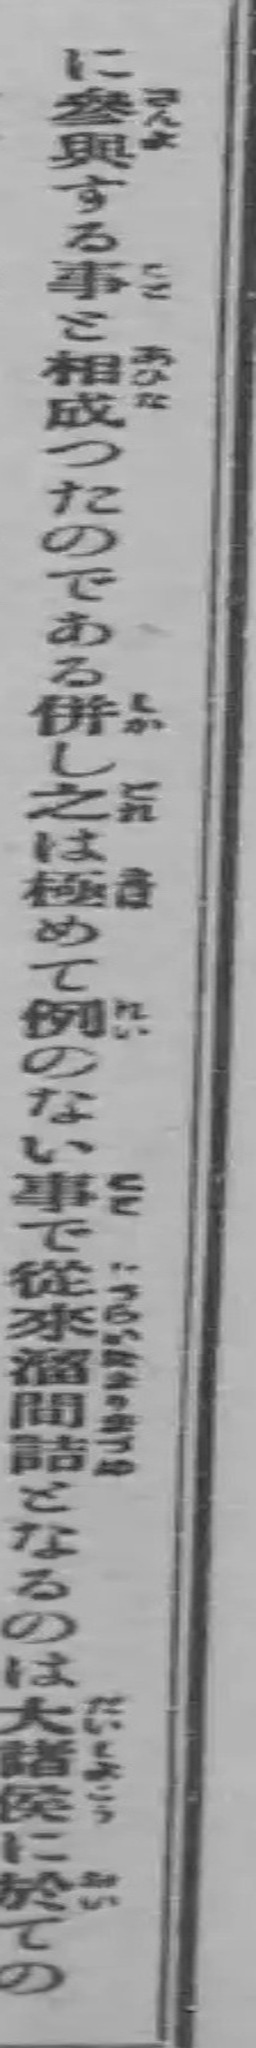に参与する事と相成つたのである併し之は極めて例のない事で従来溜間詰となるのは大諸侯に於ての
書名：豊橋市史談
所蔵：国立国会図書館 National Diet Library, JAPAN
